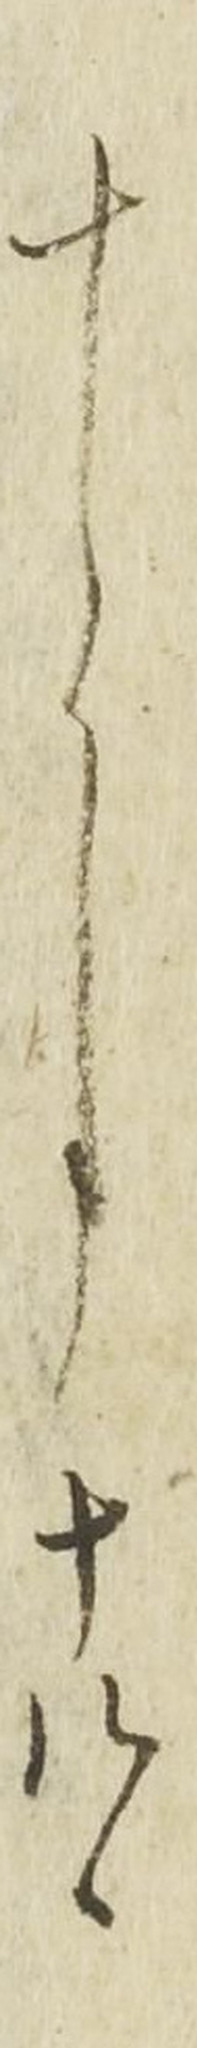十月十八日
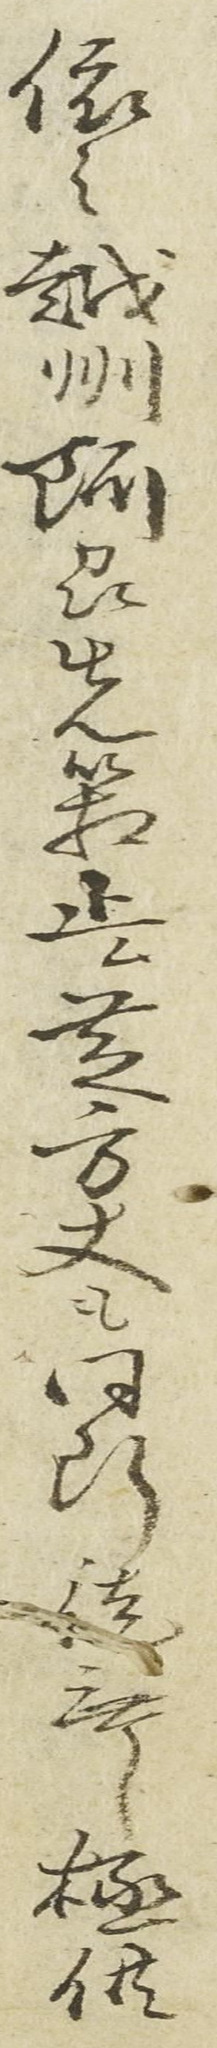依之越州阿州先箱止ム芝方丈も同断徒無し極供
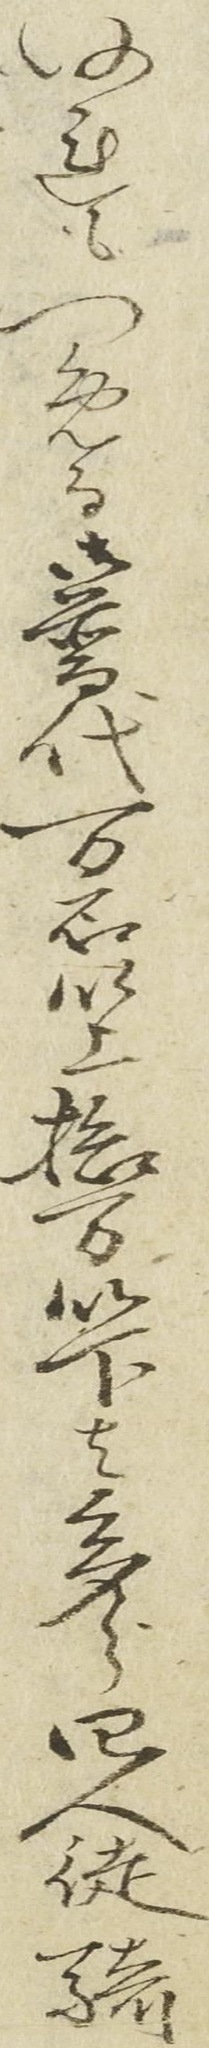何れもつめる御普代万石以上拾万以下を多分四人徒騎
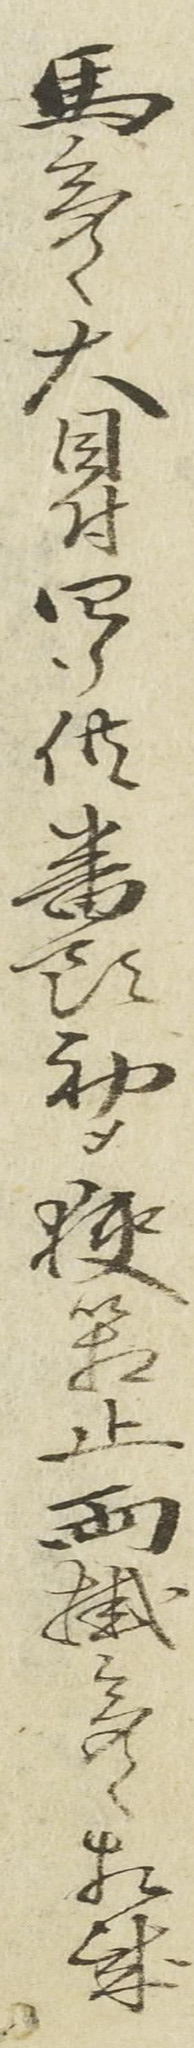馬多く大目付四ツ供番頭頭初メ狭箱止両掛多く相成
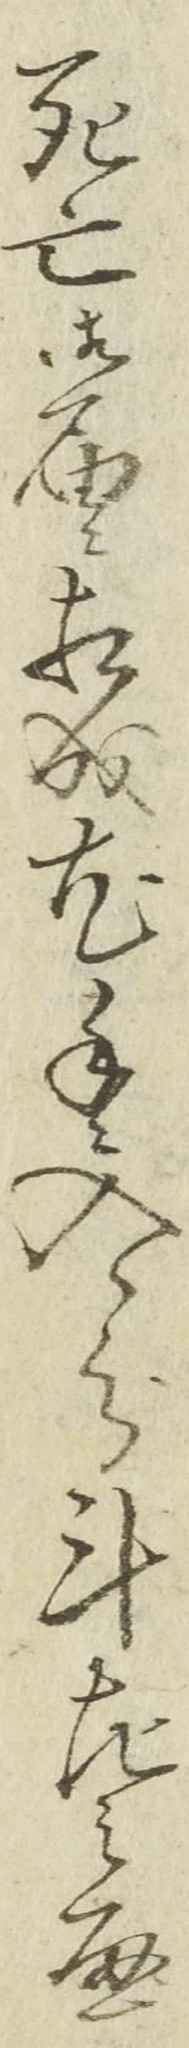死亡御届二相成尤手ニ入候分斗左之通
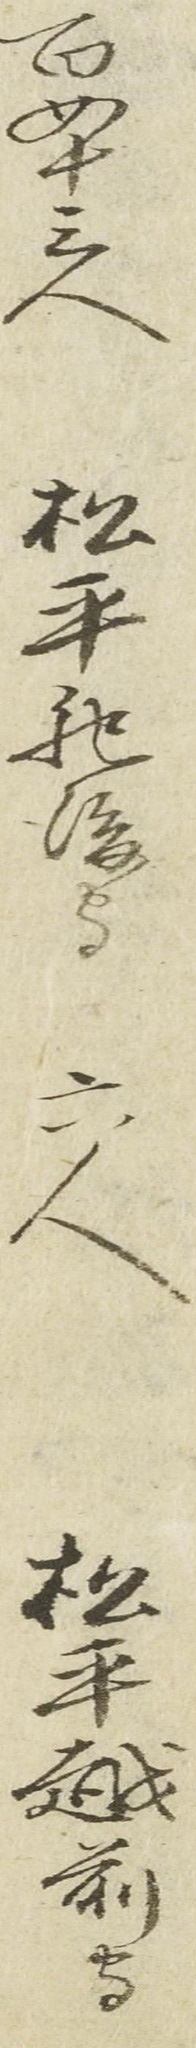百四十三人松平肥後守六人松平越前守
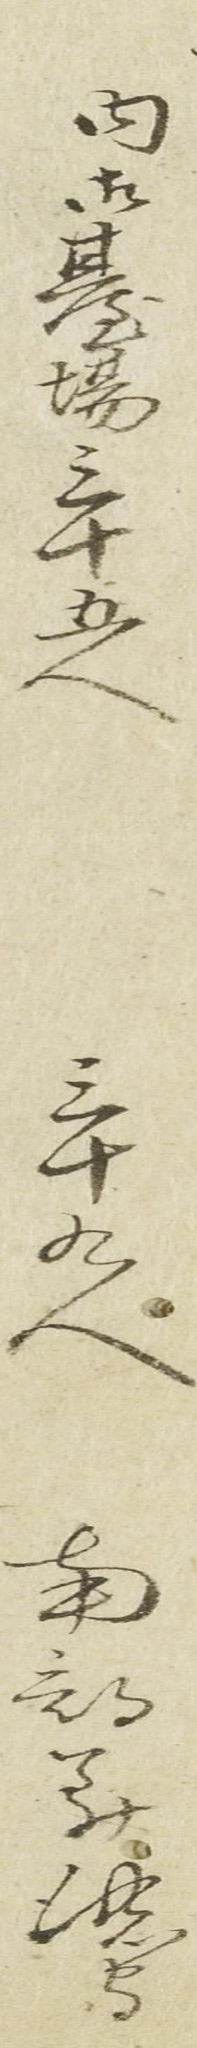内御台場三十五人三十九人南部美濃守
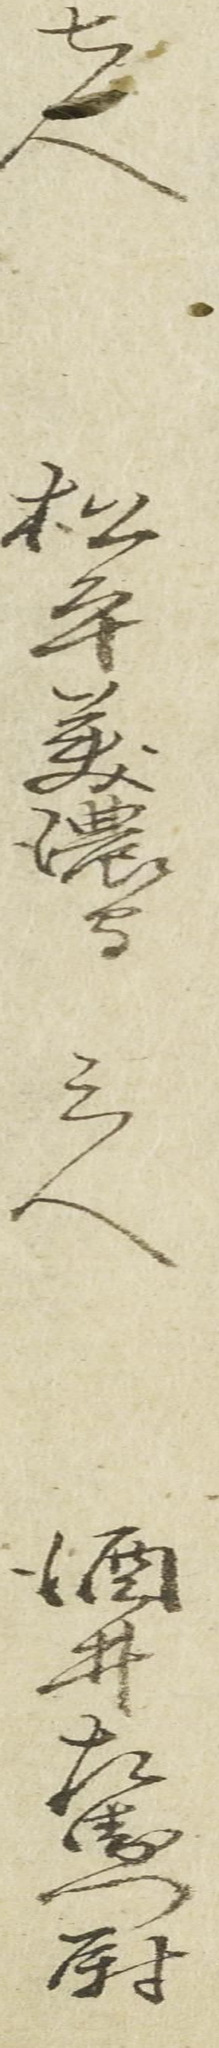七人松平美濃守三人酒井左衛門尉
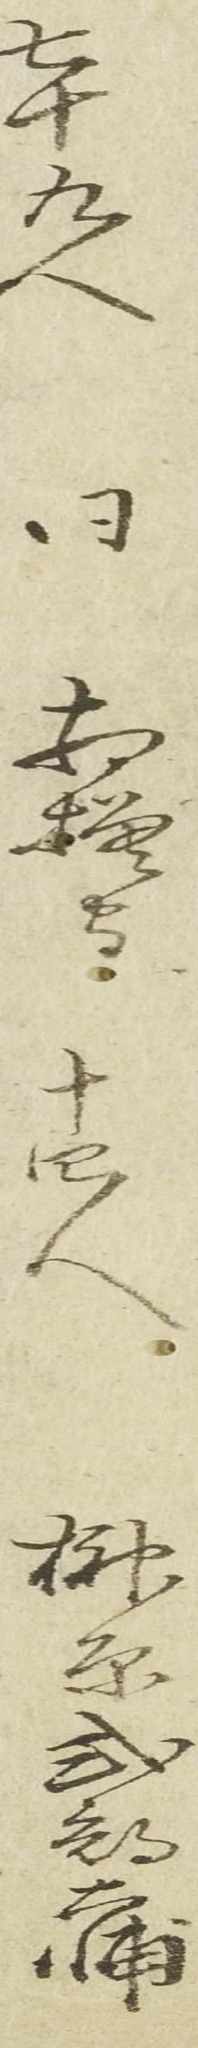七十九人同相模守十四人榊原式部大輔
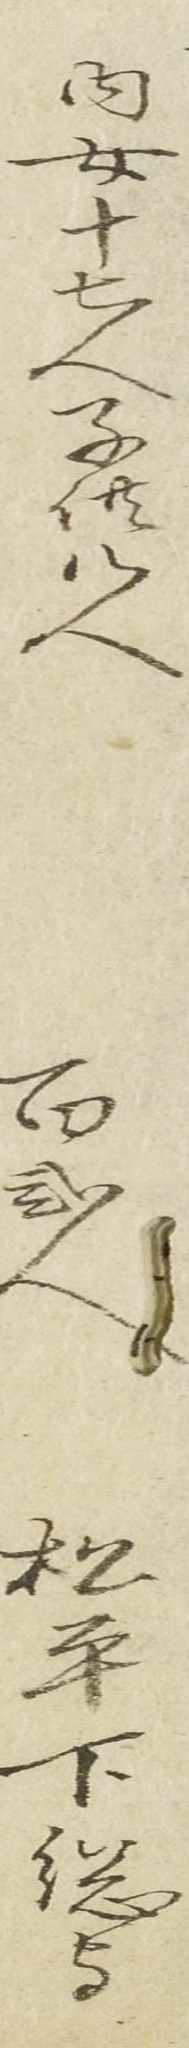内女十七人子供八人百弐人松平下総守

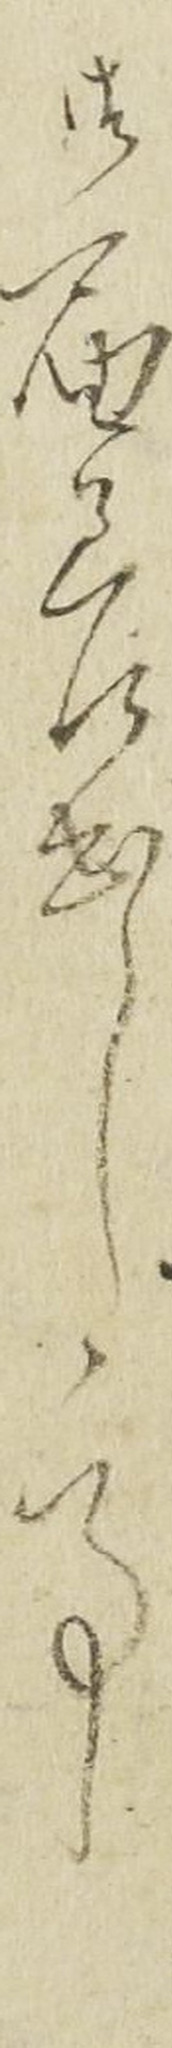御届差出し候事
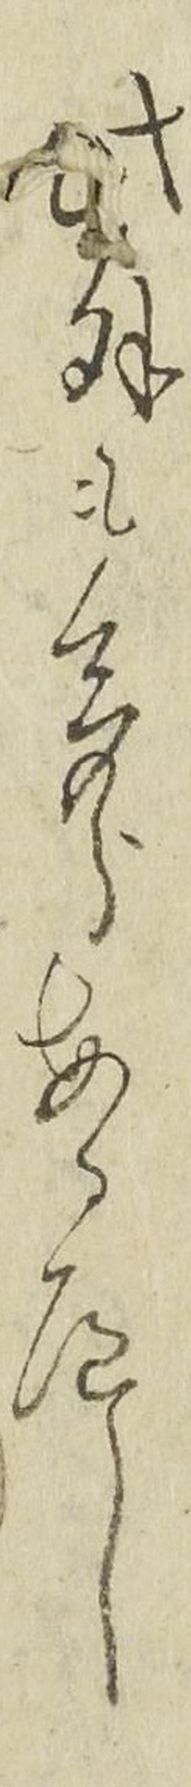此外も多分あるべし

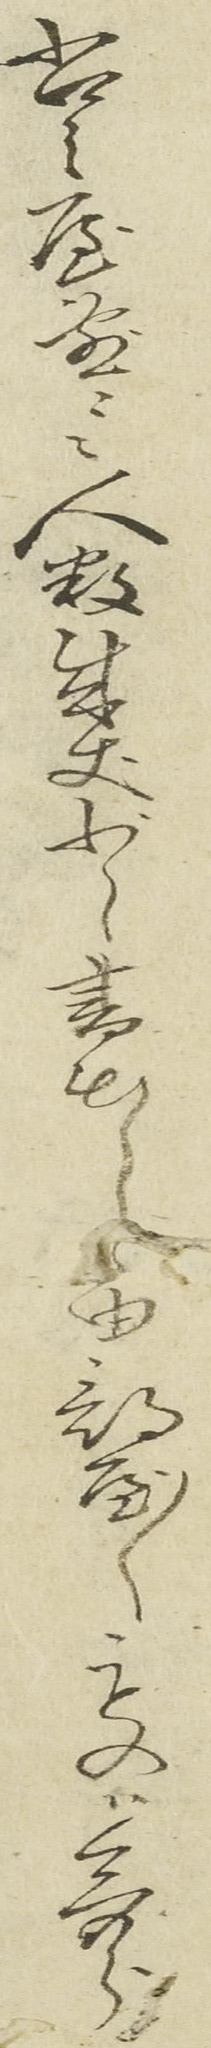右之屋敷ニて人数成丈少し書出し候由部屋ものハ多分
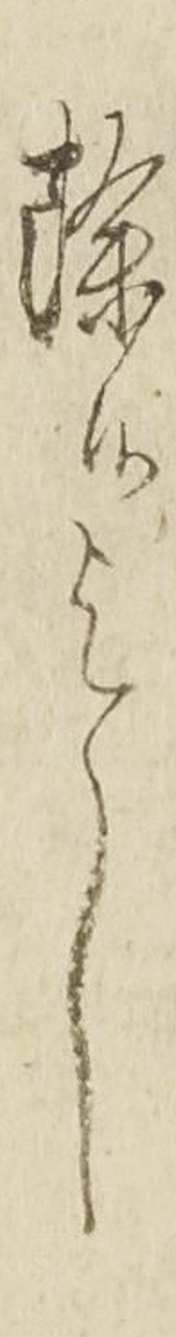除候よし
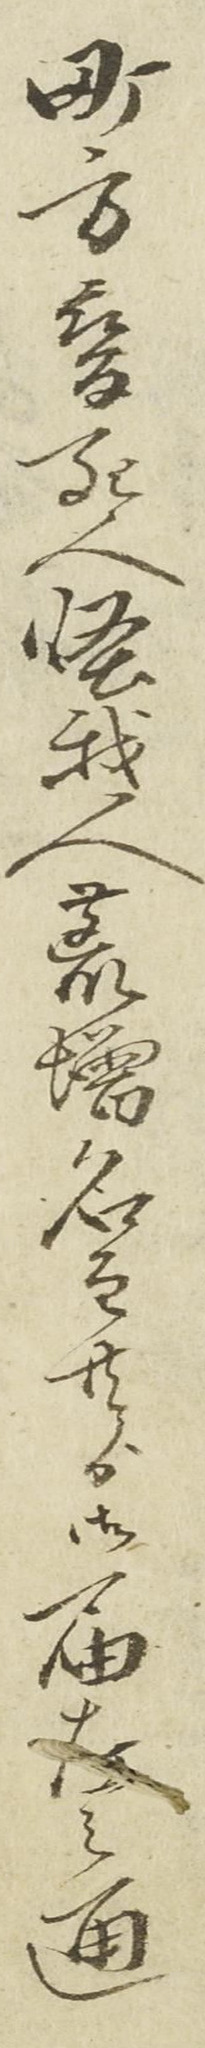町方変死人怪我人荒増名主共ゟ御届左之通
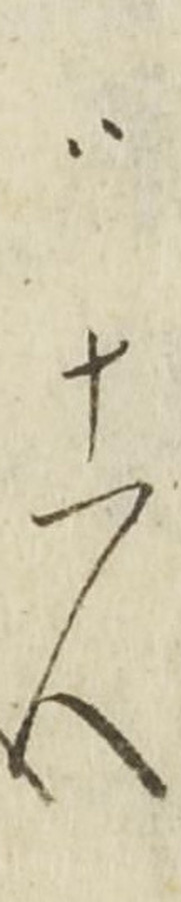同廿一人
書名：安政二乙卯年十月二日大地震之事
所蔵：東京大学地震研究所図書室 Earthquake Research Institute Library, The University of Tokyo, JAPAN
